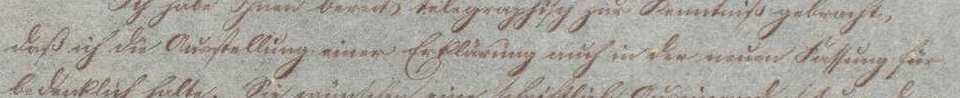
daß ich die Ausstellung einer Erklärung auch in der neuen Fassung für
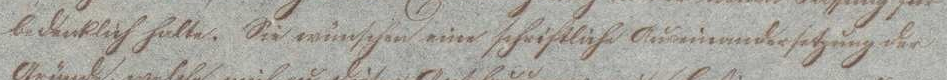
bedenklich halte. Sie wünschen eine schriftliche Auseinandersetzung der
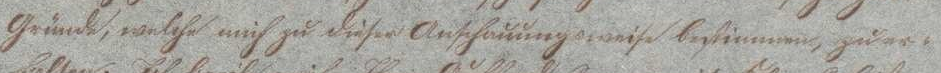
Gründe, welche mich zu dieser Anschauungsweise bestimmen, zu er-
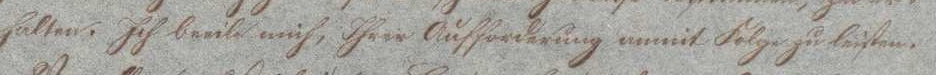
halten. Ich beeile mich, Ihrer Aufforderung anmit Folge zu leisten.
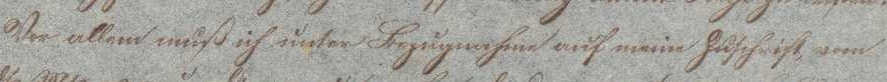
Vor allem muß ich unter Bezugnahme auf meine Zuschrift vom
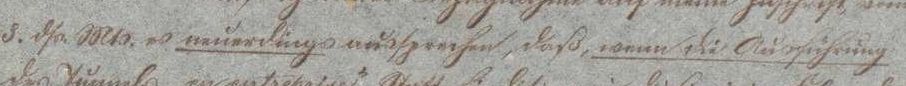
3. dss Mots. es neuerdings aussprechen, daß, wenn die Ausführung
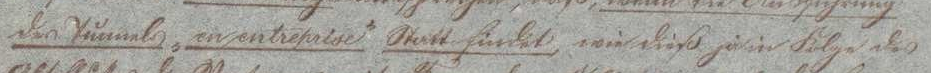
des Tunnels «en entreprise» Statt hiermit, wie dieß ja in Folge des
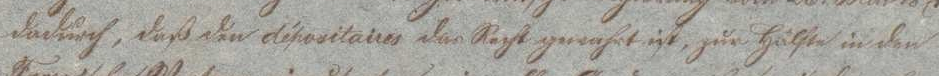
dadurch, daß den dépositaires das Recht gewahrt ist, zur Hälfte in den
